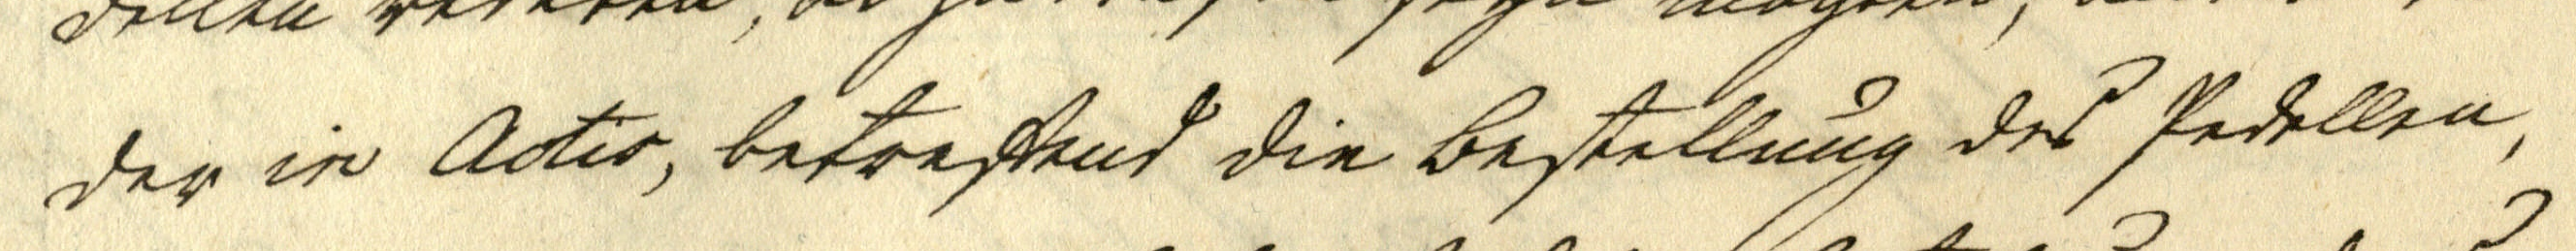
der in Actis, betreffend die Bestellung des Pedellen,
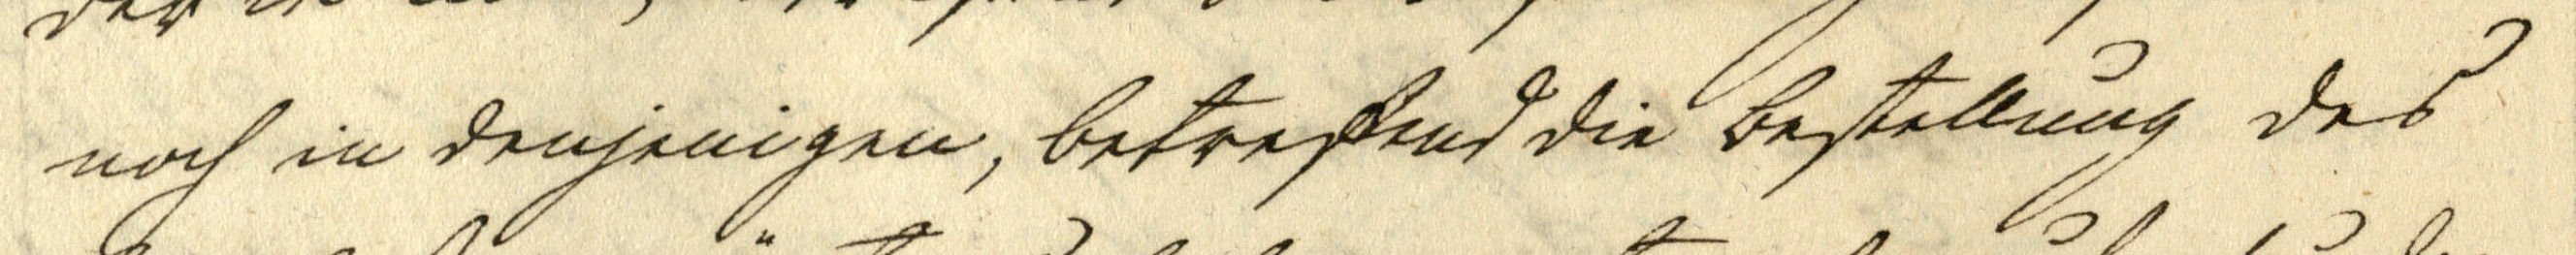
noch in denjenigen, betreffend die Bestellung des
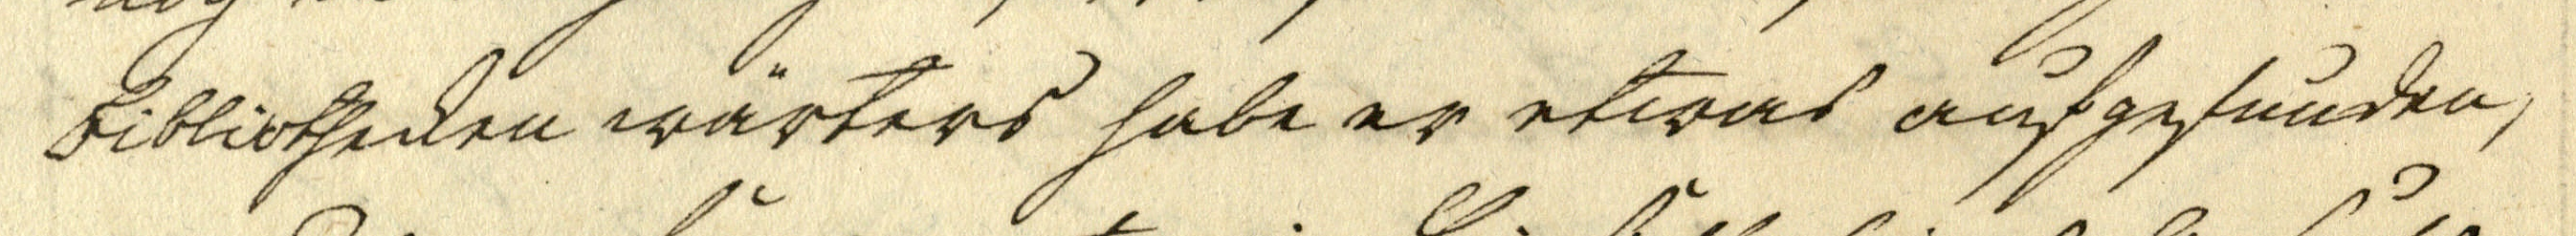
Bibliothecken wärters habe er etwas aufgefunden,
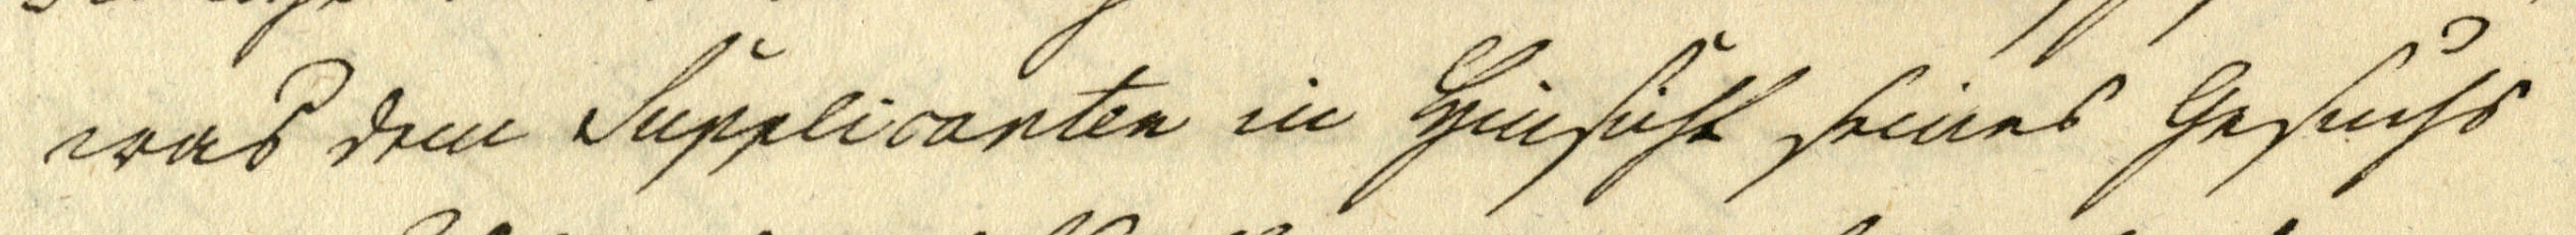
was dem Supplicanten in Hinsicht seines Gesuchs
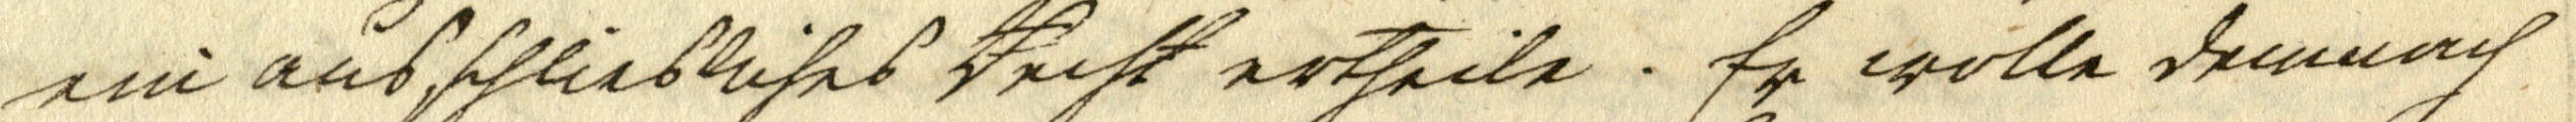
ein ausschliesliches Recht ertheile. Er wolle demnach
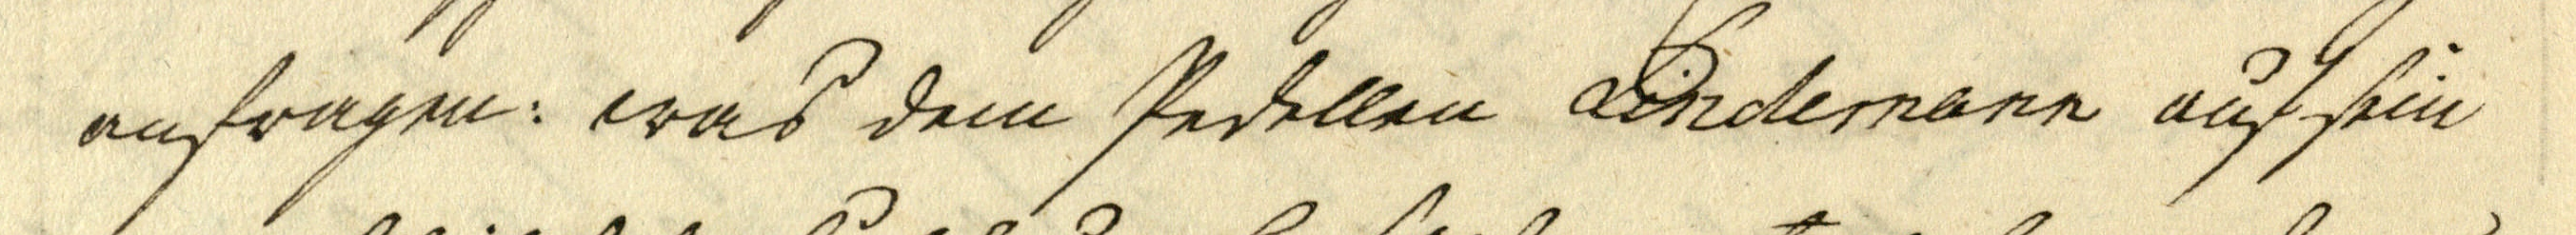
anfragen: was dem Pedellen Lindemann auf sein
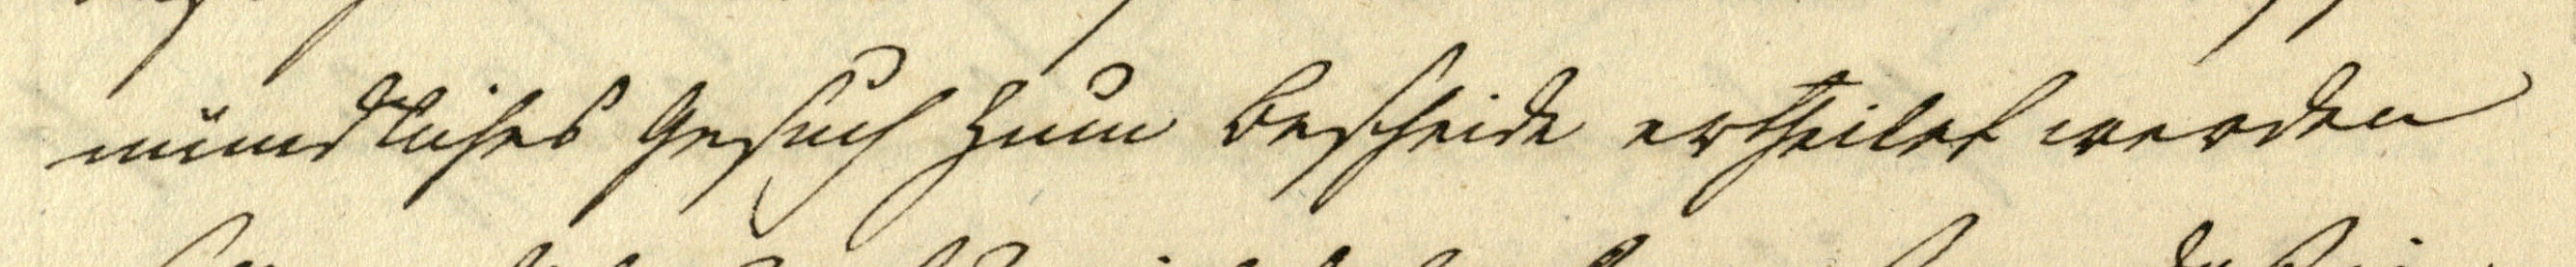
mündliches Gesuch zum Bescheide ertheilet werden
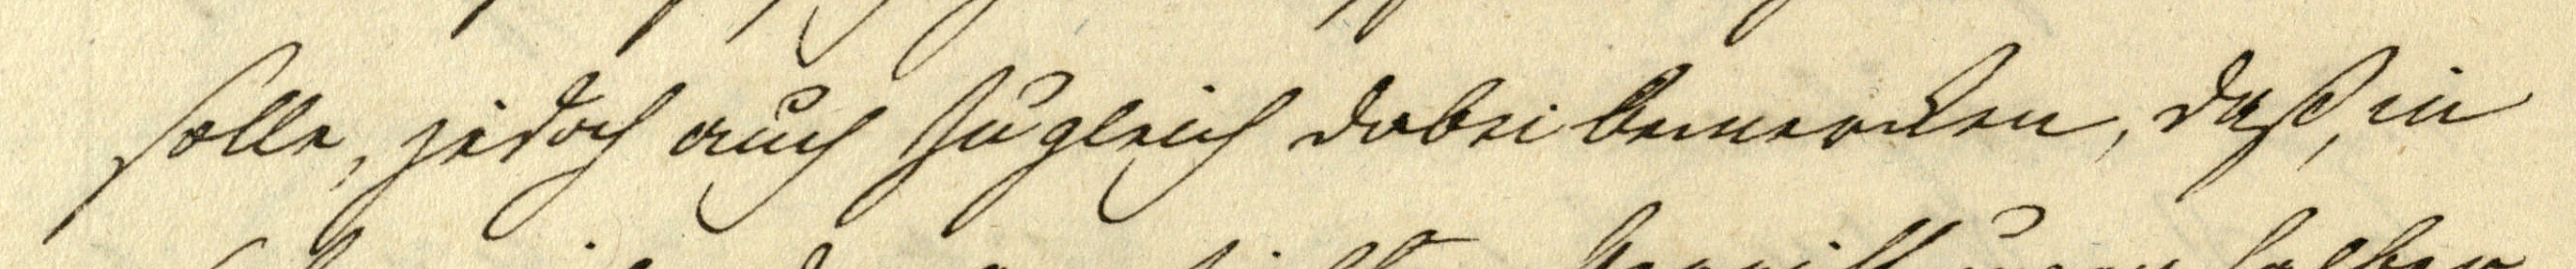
solle, jedoch auch zugleich dabei bemercken, daß, in
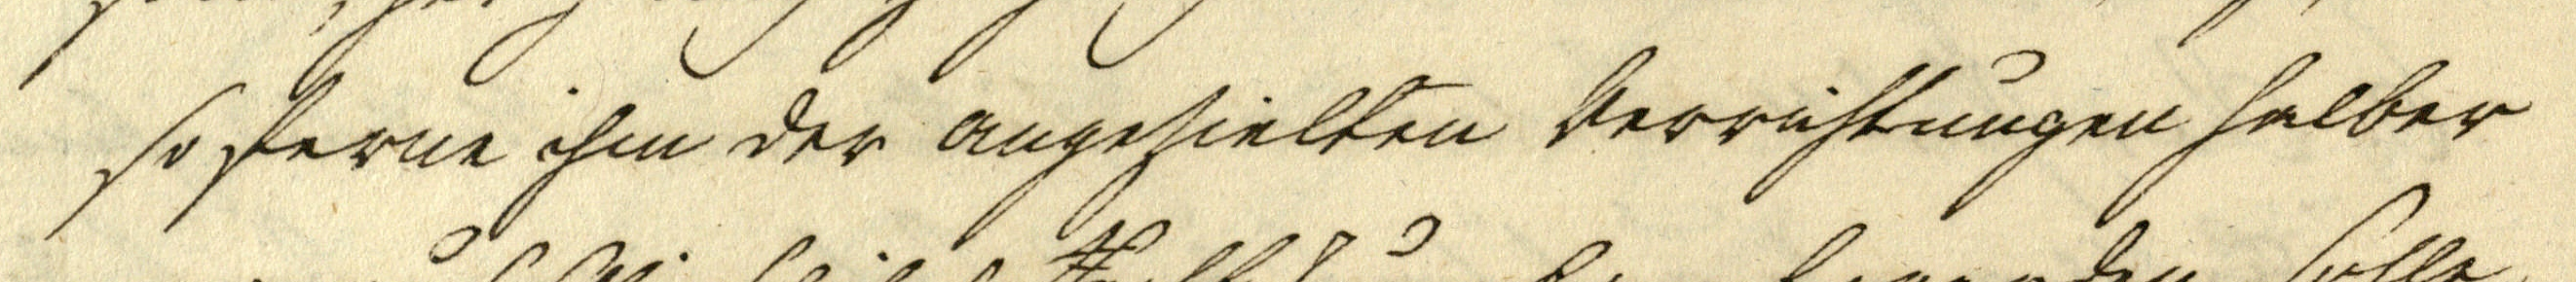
so ferne ihm der angezielten Verrichtungen halber
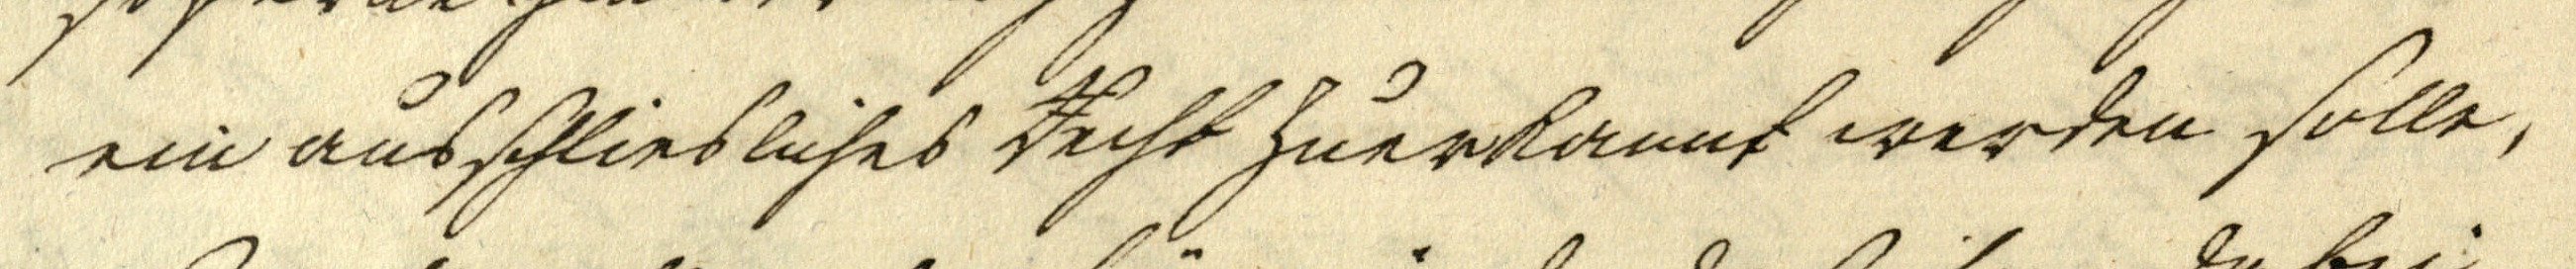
ein ausschliesliches Recht zuerkannt werden solle,
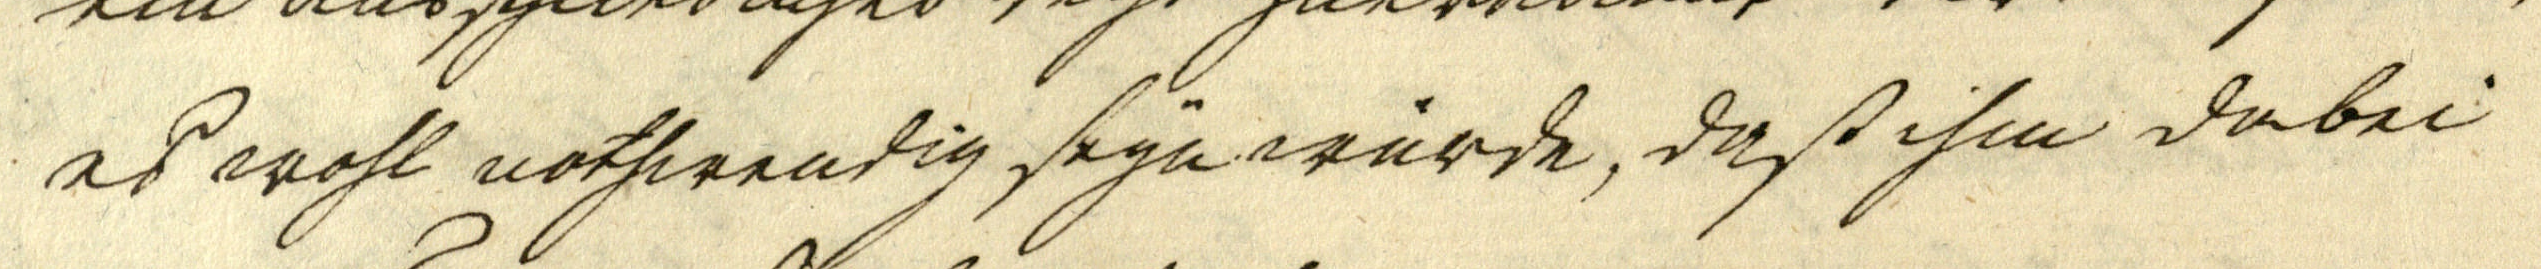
es wohl nothwendig seÿn würde, daß ihm dabei
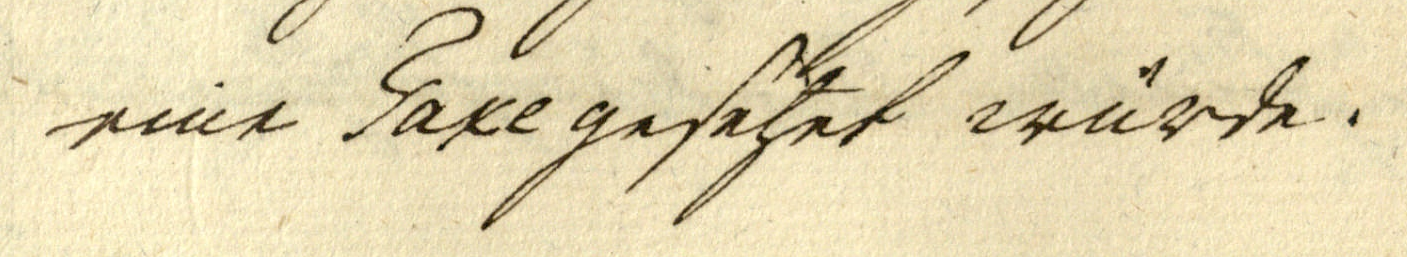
eine Taxe gesetzet würde.
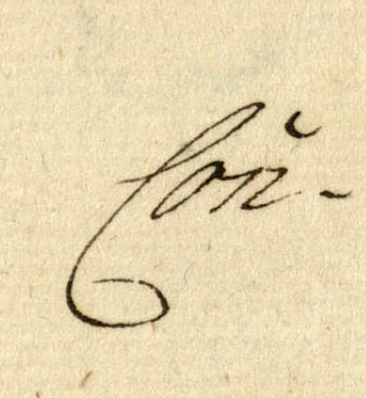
Con
